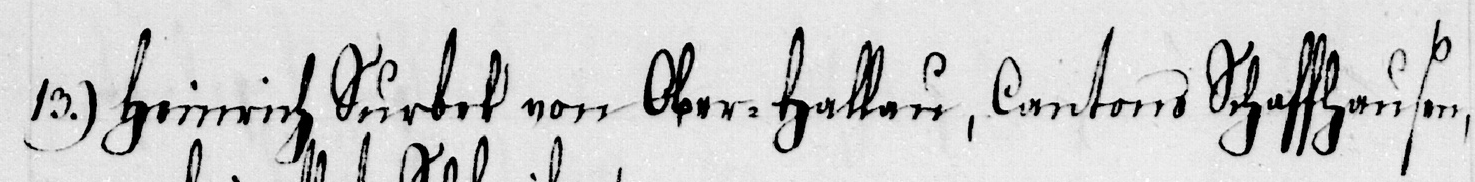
13.) Heinrich Surbel von Ober-Hallau, Cantons Schaffhause¬
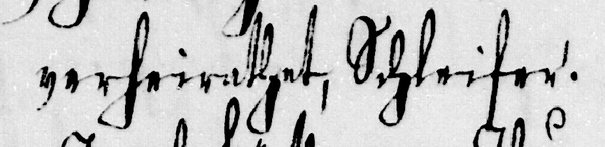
verheirathet, Schleifer.
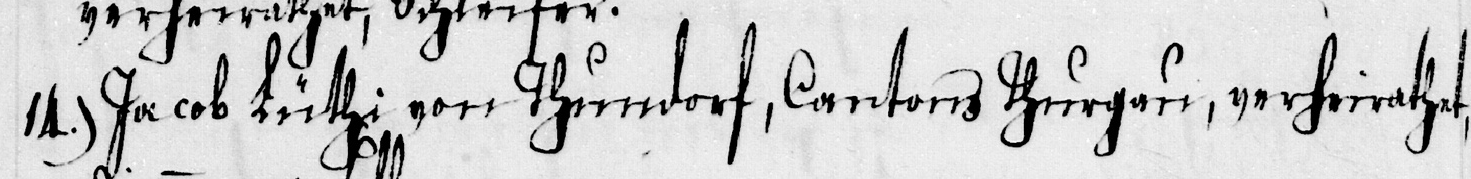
14.) Jacob Lüthi von Thundorf, Cantons Thurgau, verheirathe¬
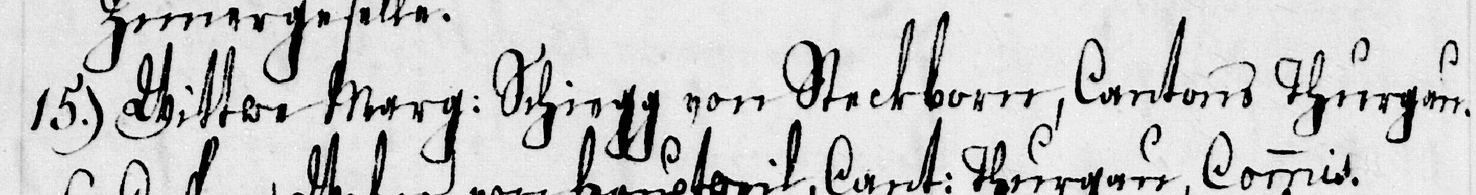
15.) Wittwe Marg: Schiegg von Steckborn, Cantons Thurgau.
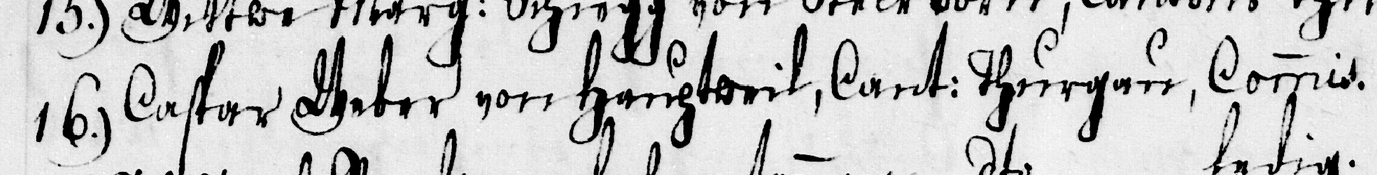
16.) Caspar Weber von Hauptweil, Cant: Thurgau, Commis.
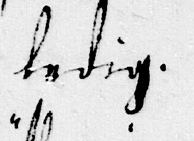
ledig.
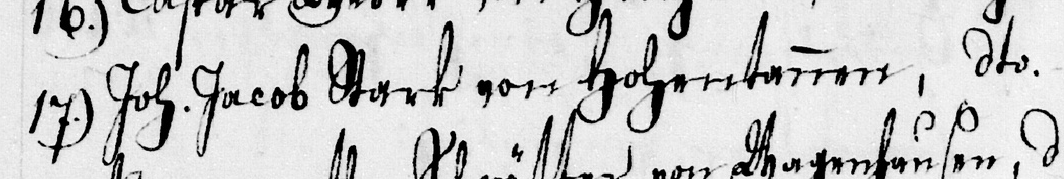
17.) Joh. Jacob Stark von Hohentannen, dto.
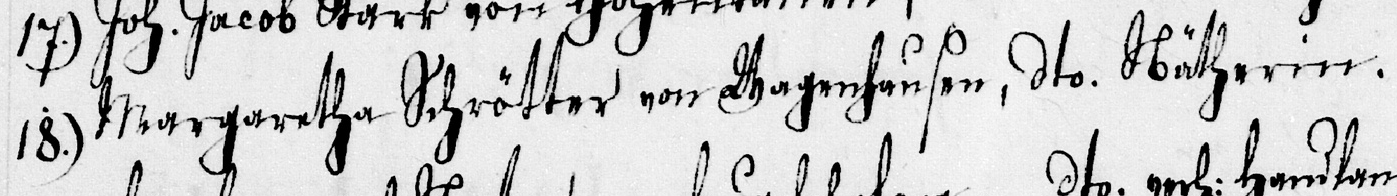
18.) Margaretha Schrötter von Wagenhausen, dto. Nätherin.
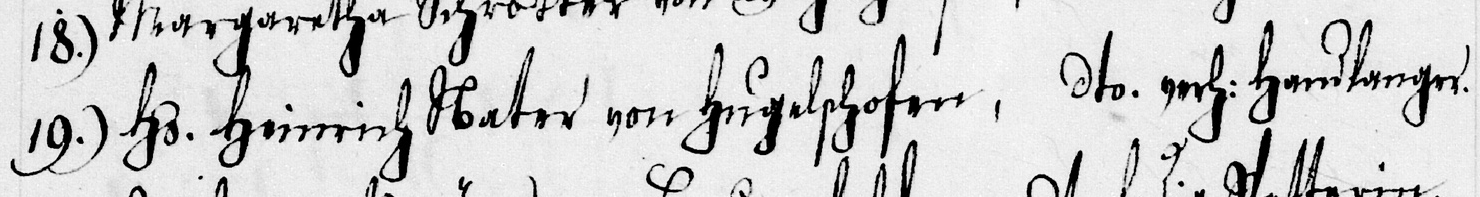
19.) Hs. Heinrich Nater von Hugelschofen, dto. verh: Handlanger.
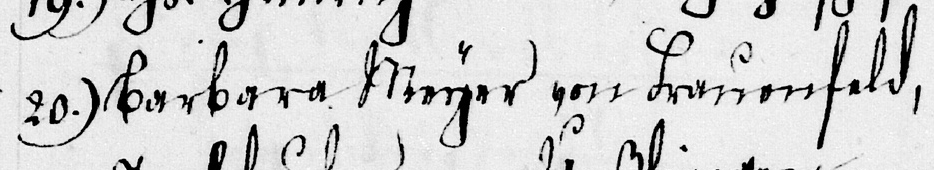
20.) Barbara Meyer von Frauenfeld,
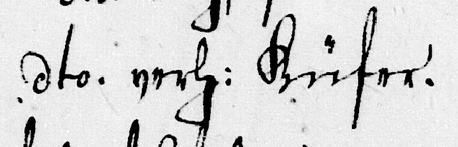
dto. verh: Küfer.
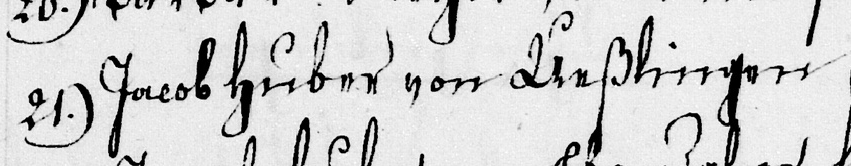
21.) Jacob Huber von Ueßlingen,
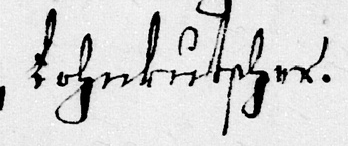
Lohnkutscher.
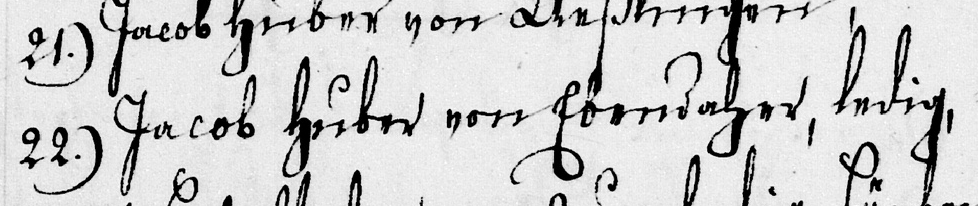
22.) Jacob Huber von Ebendaher, ledig,
